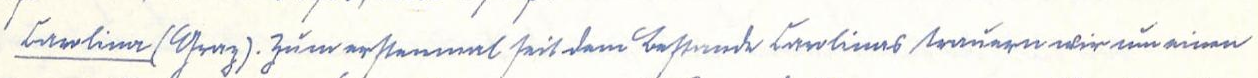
Carolina (Graz). Zum erstenmal seit dem Bestande der Carolines trauern wir im einen
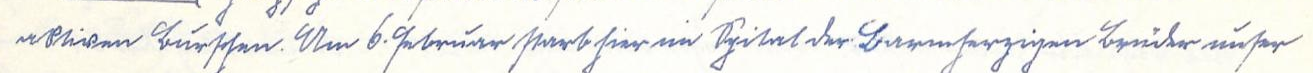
aktiven Burschen. Am 6. Februar starb hier im Spital der barmherzigen Brüder unser
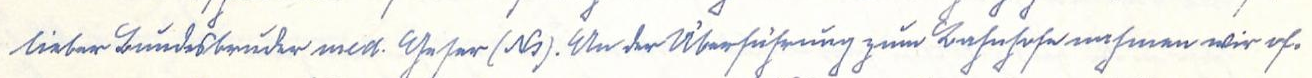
lieber Bundesbruder med. Geser (Ns). An der Überführung zum Bahnhofe nahmen wir of-
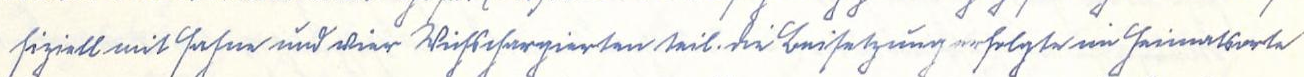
fiziell mit Fahnen und vier Wichschargierten teil. Die Beisetzung erfolgte im Heimatorte
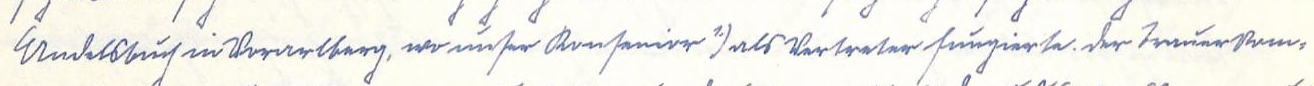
Andelsbuch in Vorarlberg, wo unser Konsenior 1) als Vertreter fungierte. Der Trauerkom-
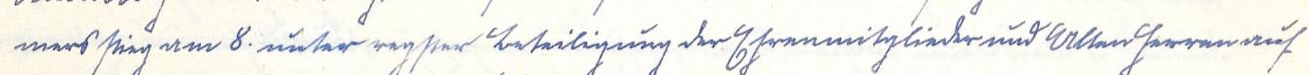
mers stieg am 8. unter regster Beteiligung der Ehrenmitglieder und Alten Herren auf
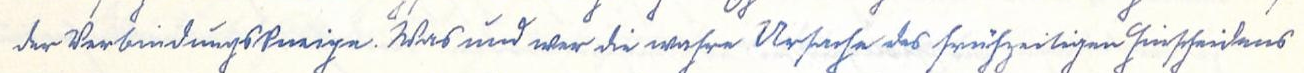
der Verbindungskneipe. Was und wer die wahre Ursache des frühzeitigen Hinscheidens
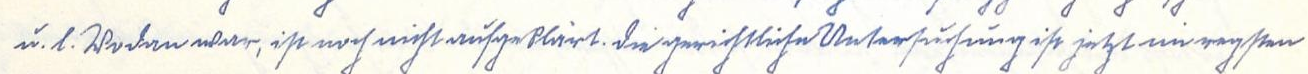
u. l. Wodan waren, ist noch nicht aufgeklärt. Die gerichtliche Untersuchung ist jetzt im regsten
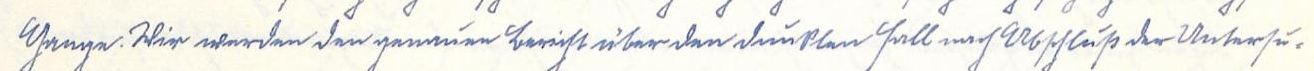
Gange. Wir werden den genauen Bericht über den dunklen Fall nach Abschluß der Untersu-
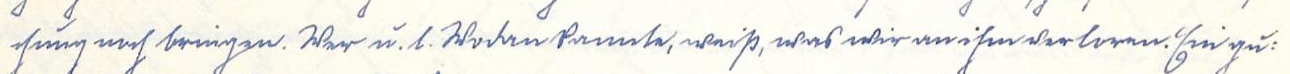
chung noch bringen. Wer u. l. Wodan kannte weiß, was wir an ihm verloren. Ein gu-
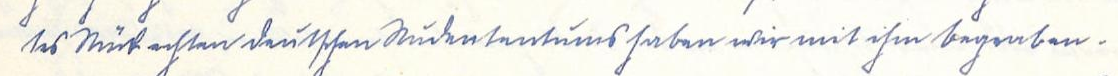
tes Stück echten deutschen Studententums haben wir mit ihm begraben…
